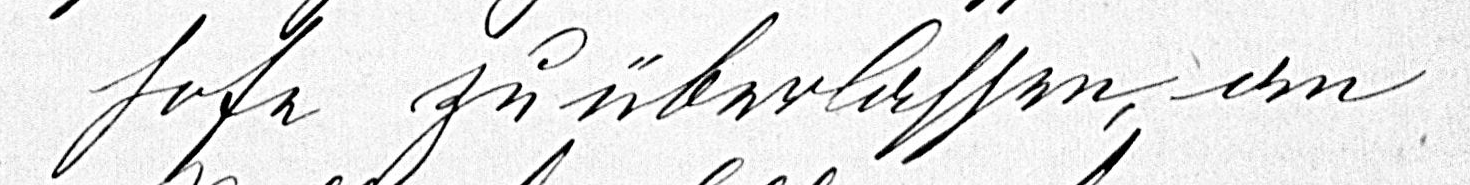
hofe zu überlassen, an
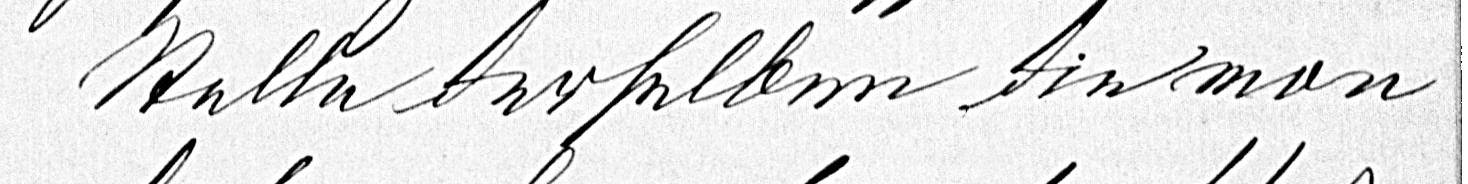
Stelle derselben die man
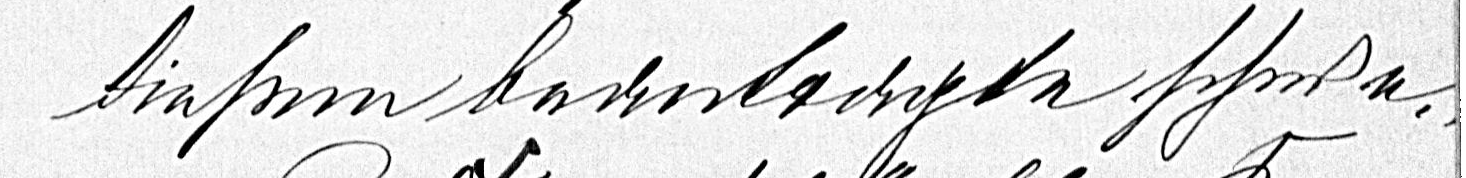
diesem beantragte schwe¬
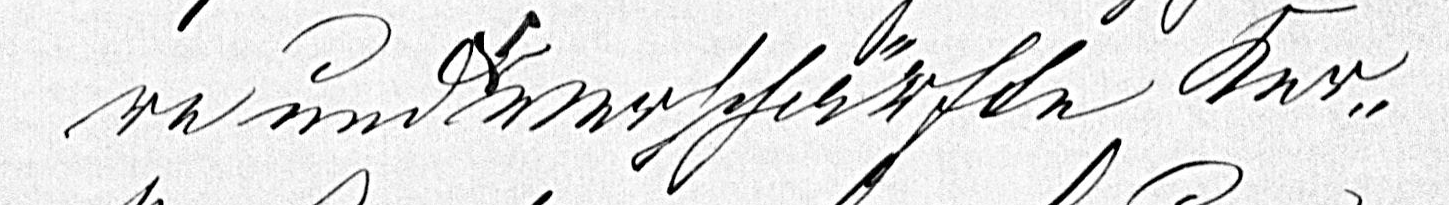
re und verschärfte Ker¬
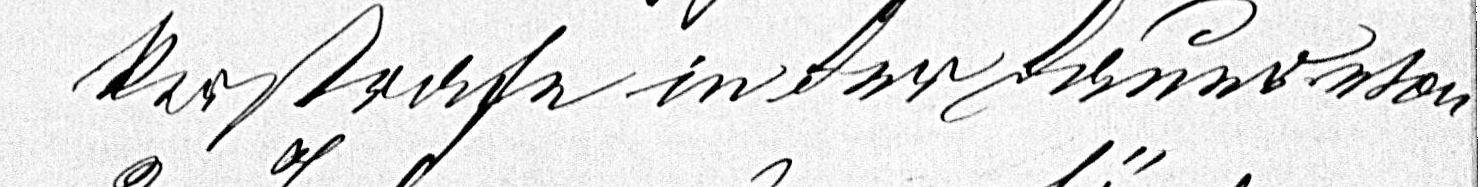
kerstrafe in der Dauer von
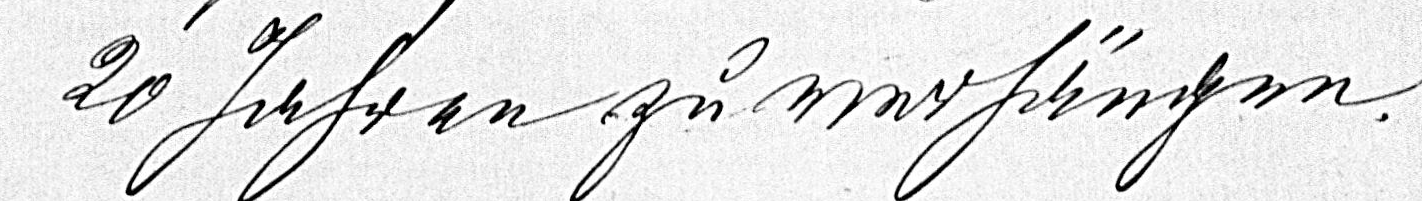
20 Jahren zu verhängen.
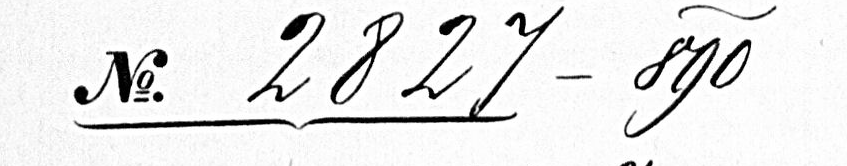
Nr. 2827-890
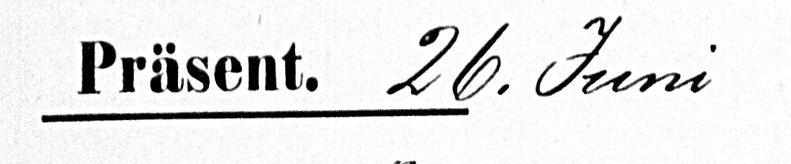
Präsent. 26. Juni
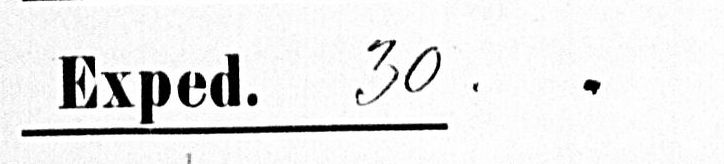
Exped. 30.
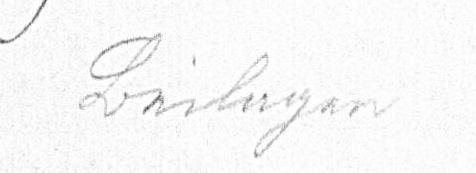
Beilagen
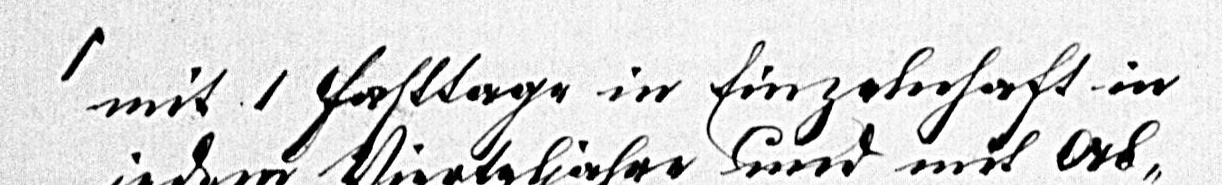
mit 1 Hafttage in Einzelnhaft in
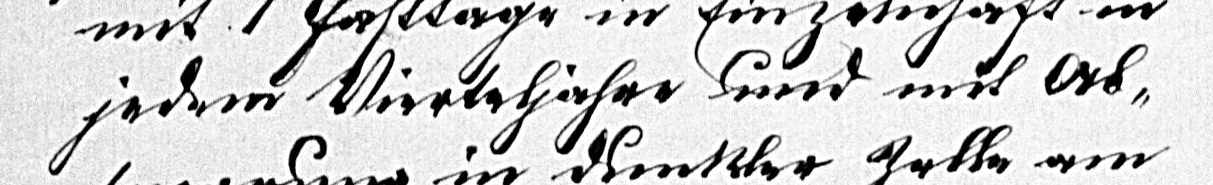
jedem Viertexx und mit Ab¬
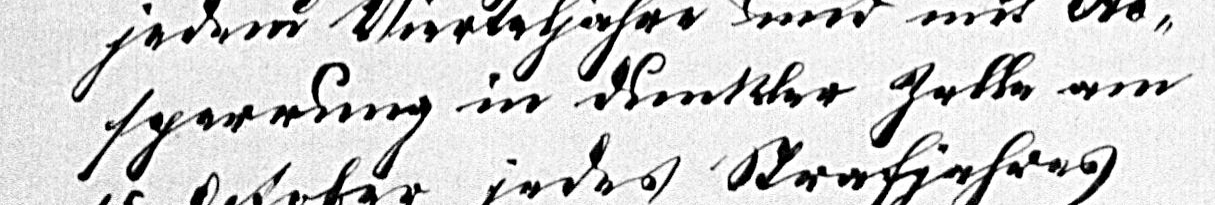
sperrung in Dunkler Zelle am
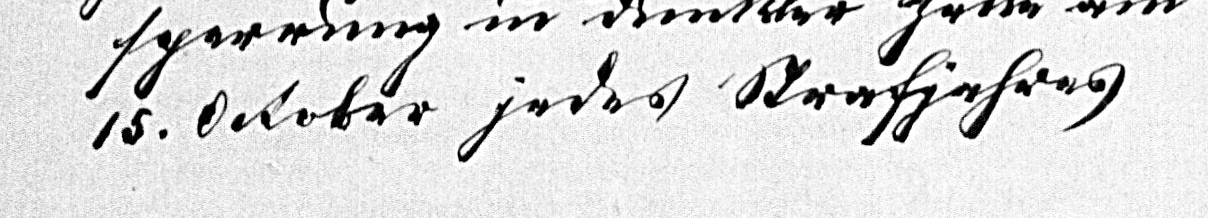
15. October jedes Strafjahres
